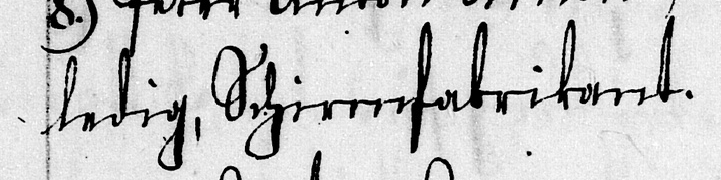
ledig, Schirmfabrikant.
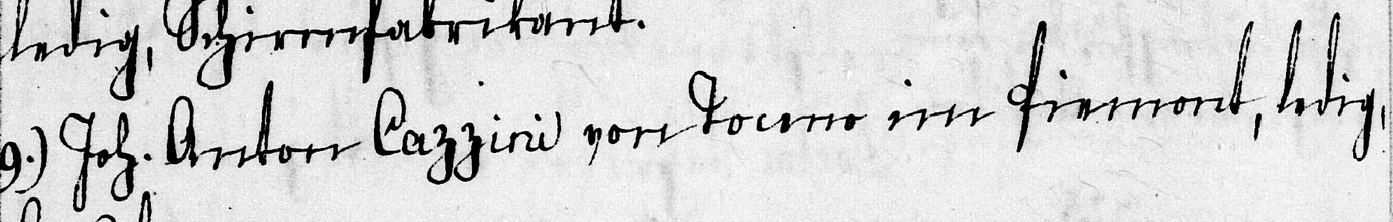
9.) Joh. Anton Cazzini von Toceno im Piemont, ledig,
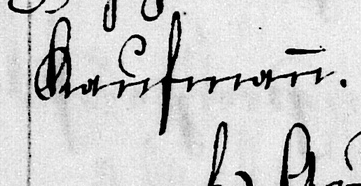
Kaufmann.
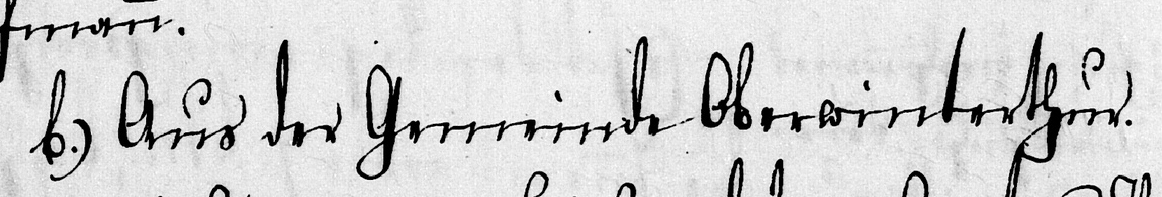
b.) Aus der Gemeinde Oberwinterthur.
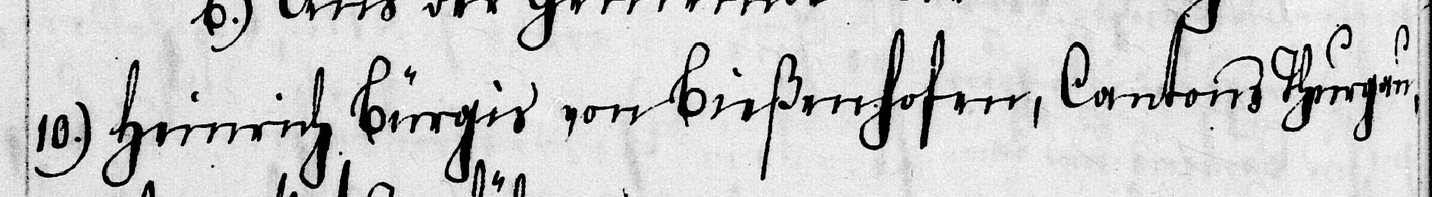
10.) Heinrich Bürgis von Bießenhofen, Cantons Thurgau,
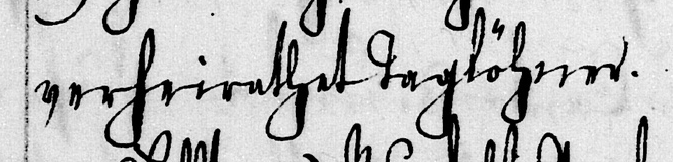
verheirathet Taglöhner.
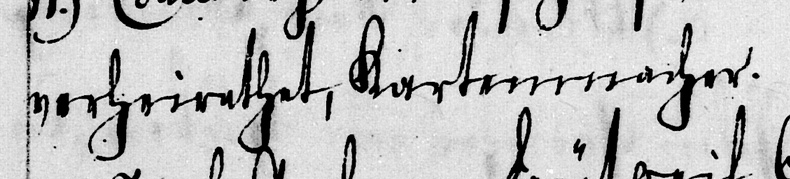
verheirathet, Kartenmacher.
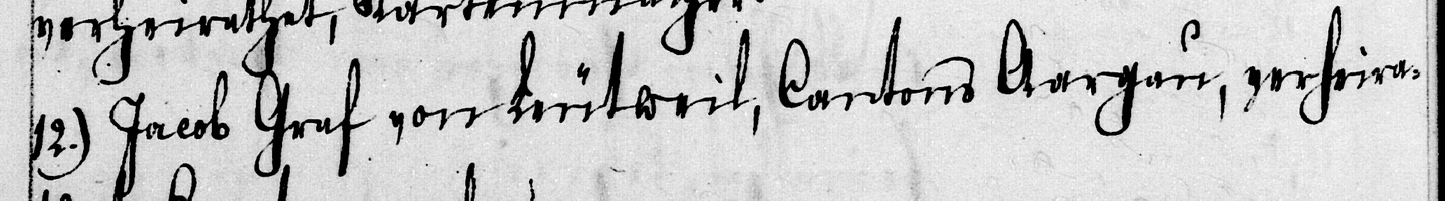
12.) Jacob Graf von Leutweil, Cantons Aargau, verheira¬
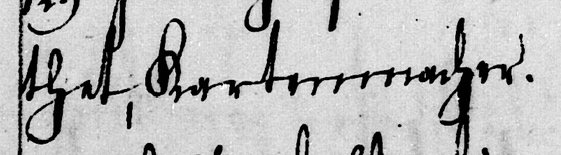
thet, Kartenmacher.
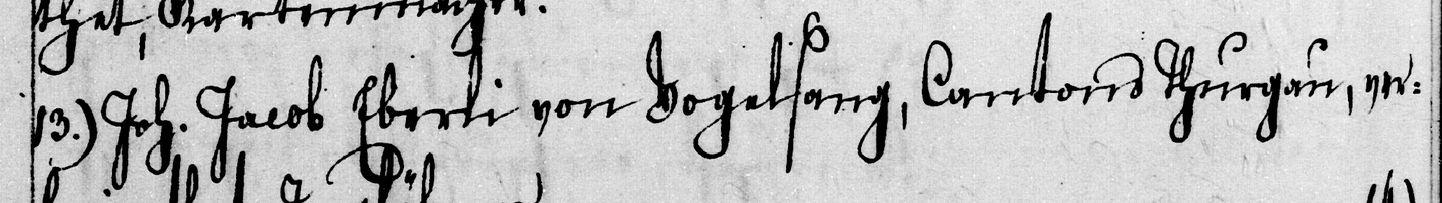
13.) Joh. Jacob Eberli von Vogelsang, Cantons Thurgau, ver¬
